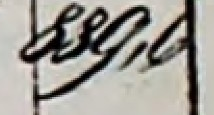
889,6
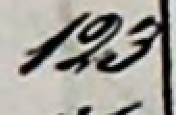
123
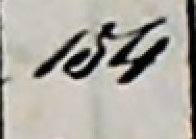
154
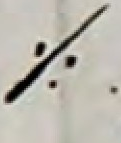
./.
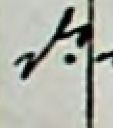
Do
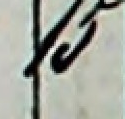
15
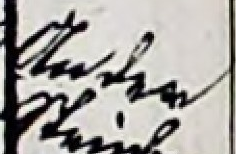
An der
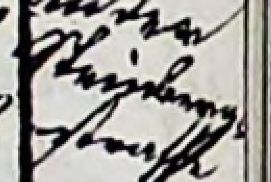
Steinberg„
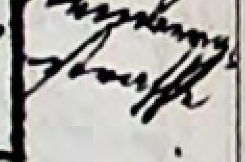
strasse
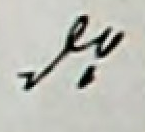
Do
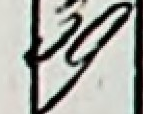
39
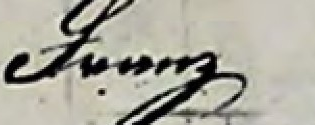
Franz
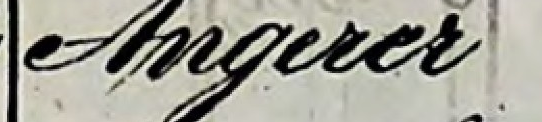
Angerer
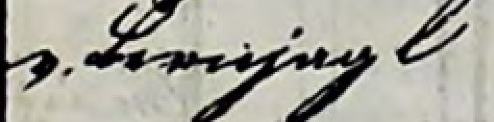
v. Bernjagl
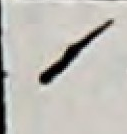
1
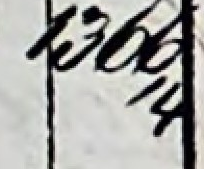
1366,4
